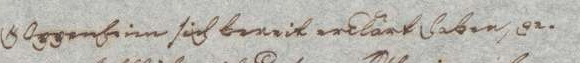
& Oppenheim sich bereit erklärt haben, ge-
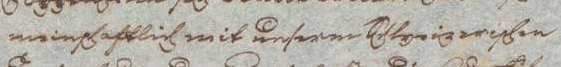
meinschaftlich mit unserm Schweizerischen
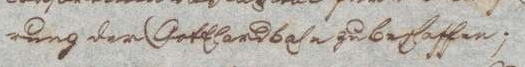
rung der Gotthardbahn zu beschaffen;
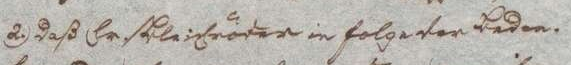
2., daß Hr. Bleichröder in Folge der Beden-
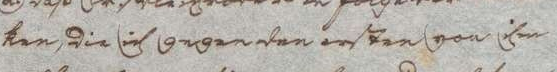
ken, die ich gegen den ersten von ihm
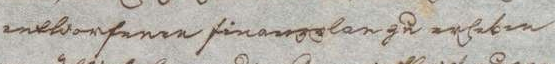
entworfenen Finanzplan zu erheben
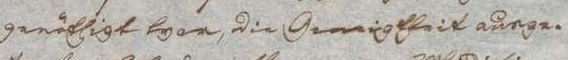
genöthigt war, die Geneigtheit ausge-
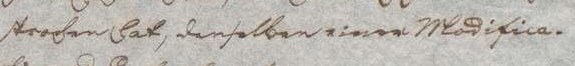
sprochen hat, denselben einer Modifica-
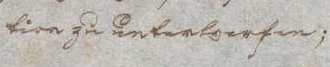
tion zu unterwerfen;
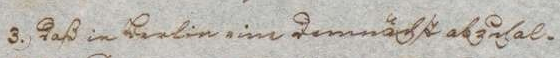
3., daß in Berlin eine demnächst abzuhal-
